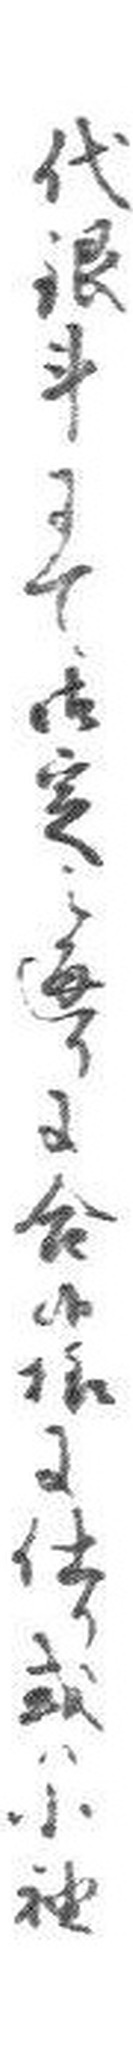代銀斗にて御定之通りに合候様に仕り或ハ小袖

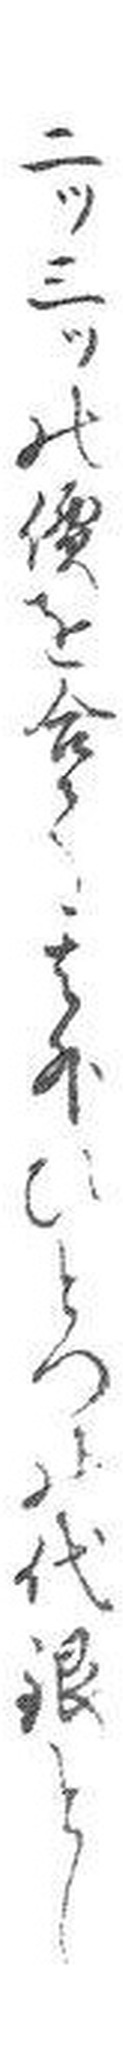二ツ三ツの價を合て其ひとつの代銀とし
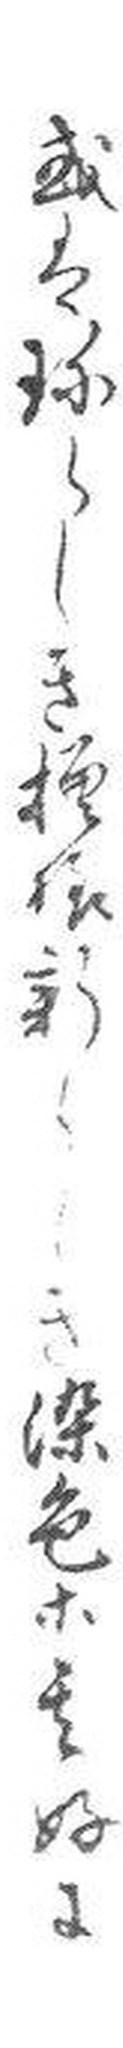或は珍らしき模様新らしき染色等其好に
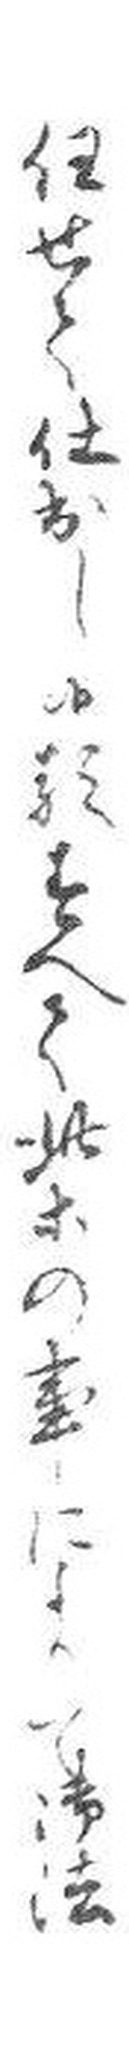任せて仕出し候類すへて此等事のによりて御法
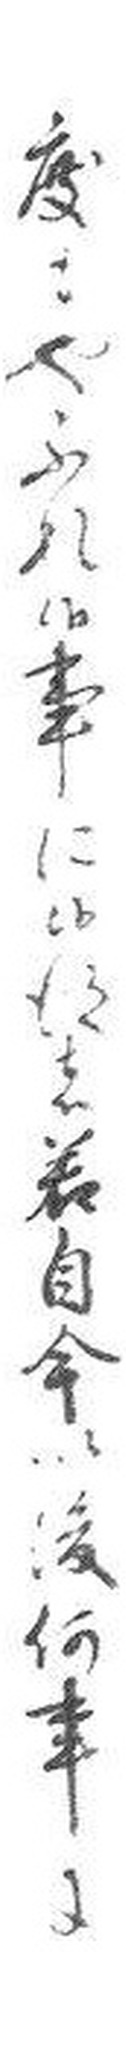度もやふれ候事に候得者若自今以後何事に
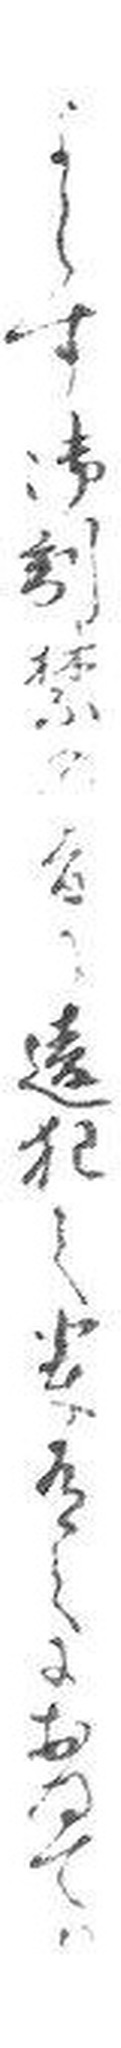よらす御制禁の旨に違犯之輩有之におゐてハ
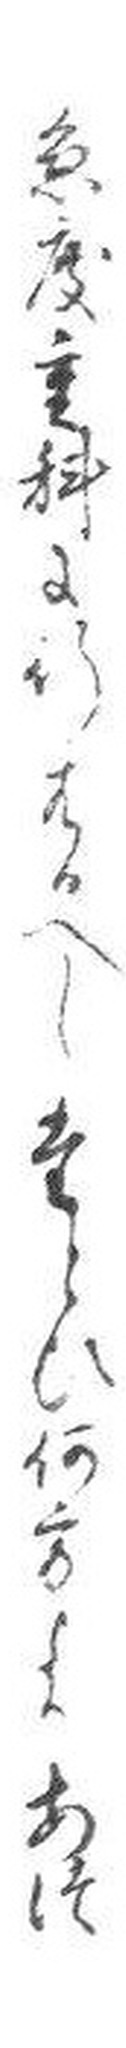急度重科に行はるへしたとひ何方共よりあつ
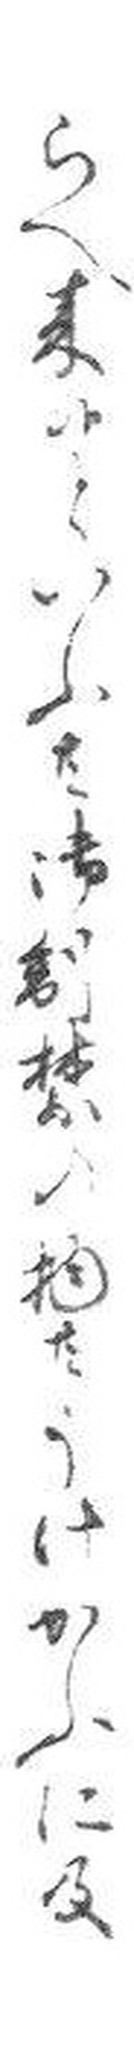らへ来候といふ共御制禁の物共うけかふに及
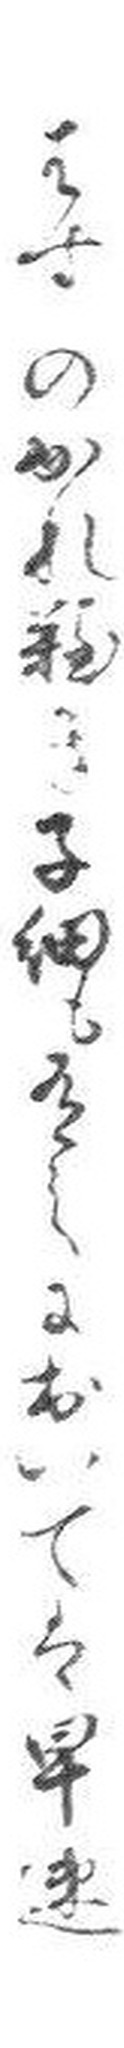はすのかれ難き子細も有之においては早速
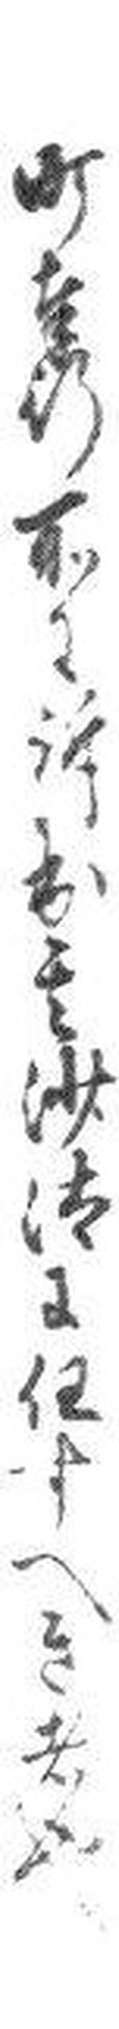町奉行所に訴出其沙汰に任すへき者也
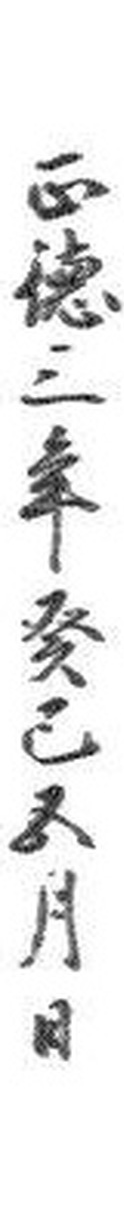正徳三年癸巳五月日
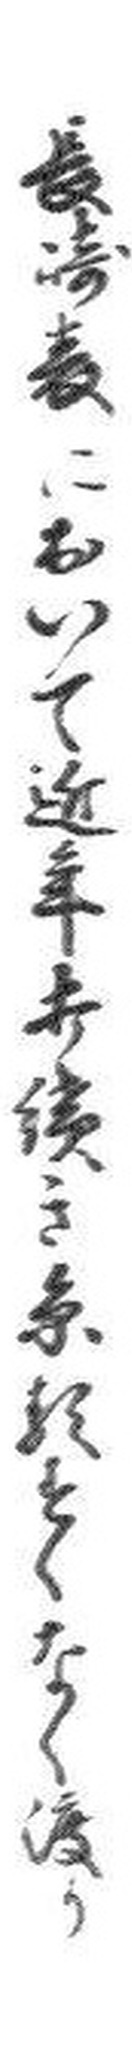長崎表において近年打続き糸類すくなく渡り
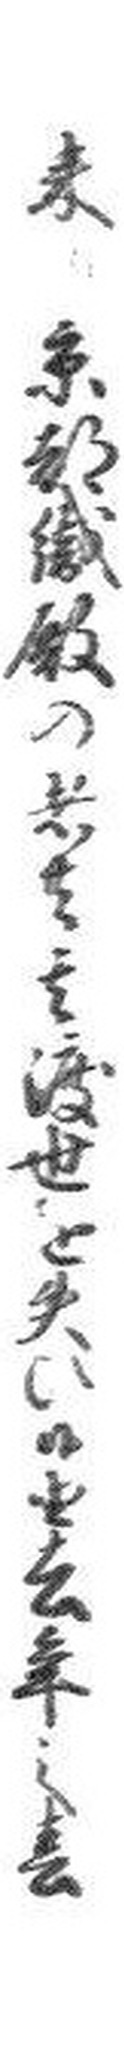来り京都織殿の者共其渡世を失ひ候由去年の春
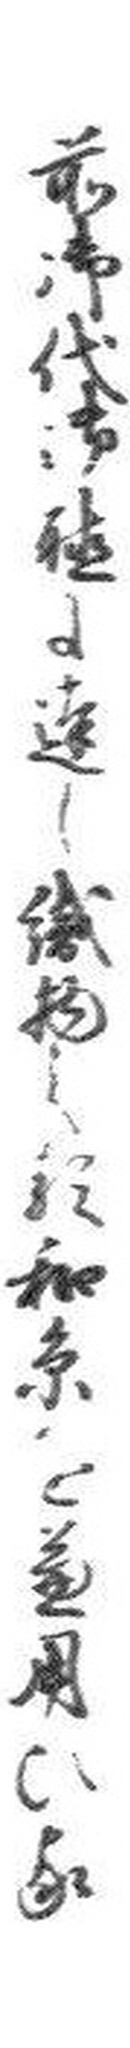前御代御聴に達し織物之類和糸を兼用ひ家
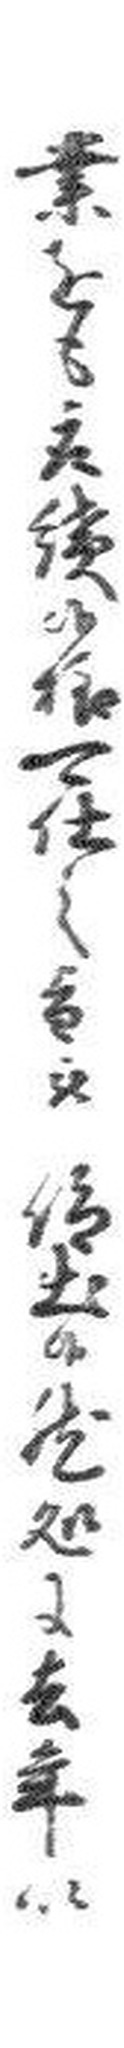業をも取続候様可仕之旨被仰出候然処に去年以
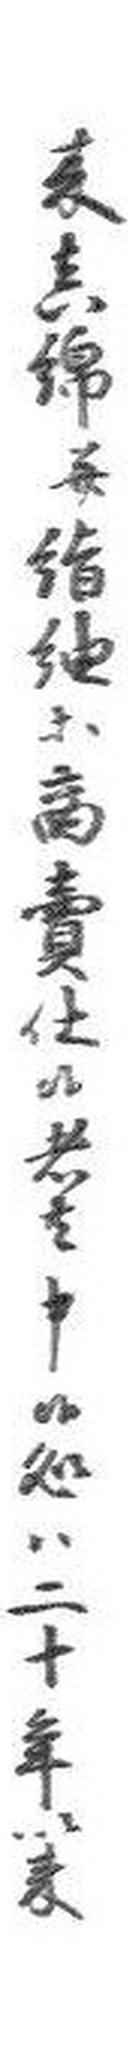来真綿并絹紬等商売仕候者共申候処ハ二十年以来
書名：家譜 二十九 吉邦公 従正徳二年到正徳三年
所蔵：福井県文書館 Fukui Prefectural Archives
